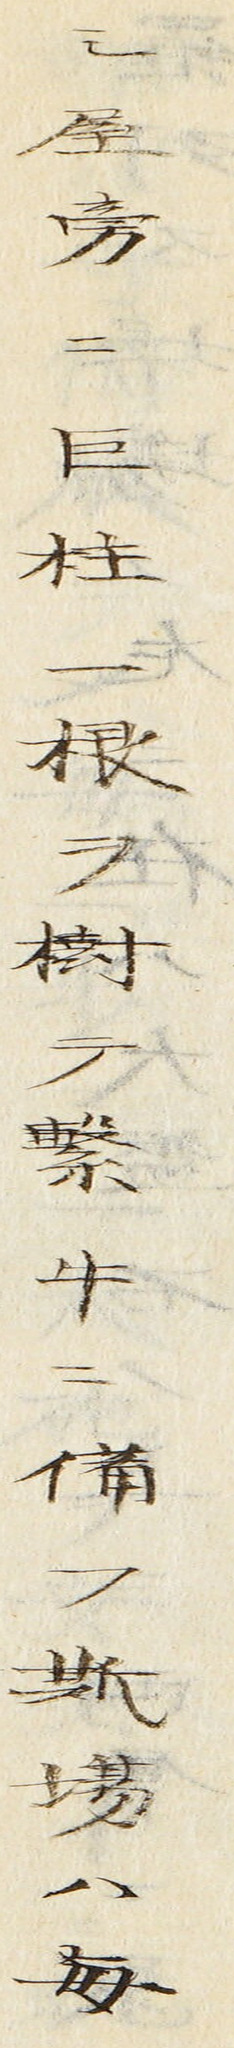シ屋旁ニ巨柱一根ヲ樹テ繁牛ニ備フ斯場ノ西
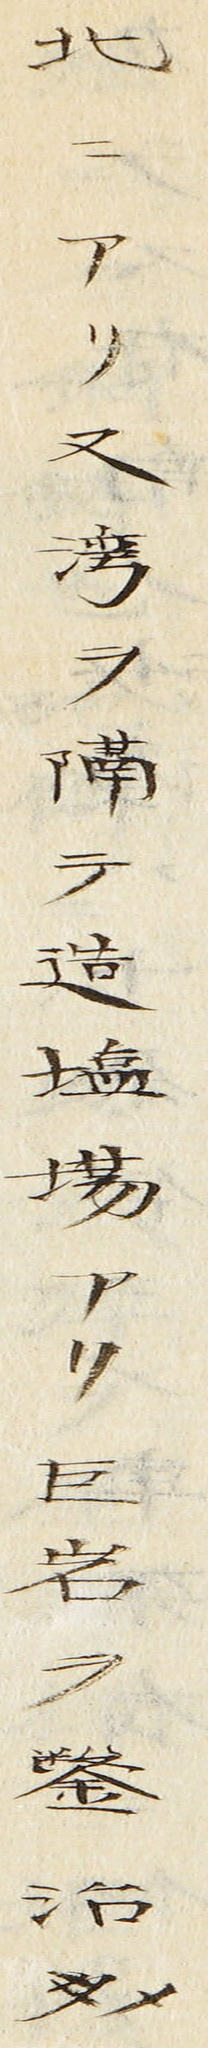北ニアリ又湾ヲ隔？テ造塩場アリ巨岩ヲ鑿？治シテ
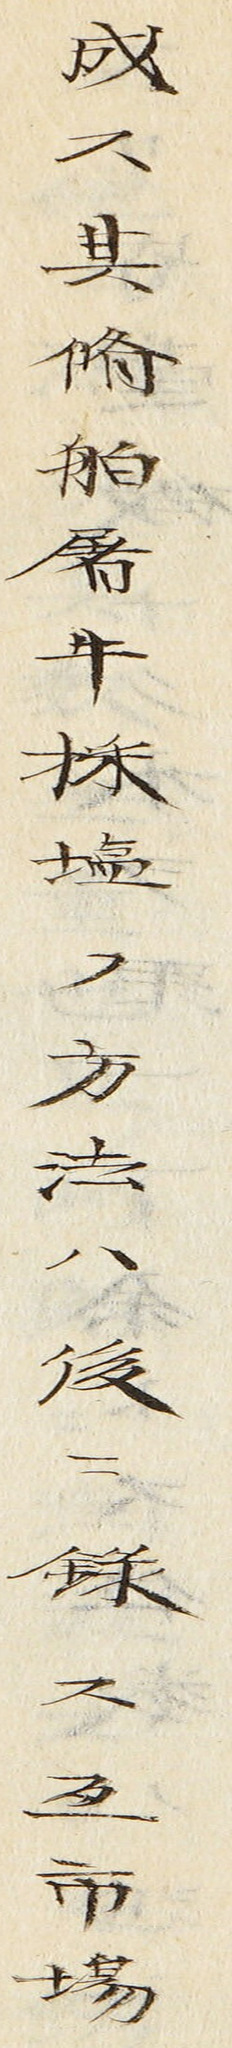成ス其脩舶屠牛採塩ノ方法ハ後ニ録ス市場
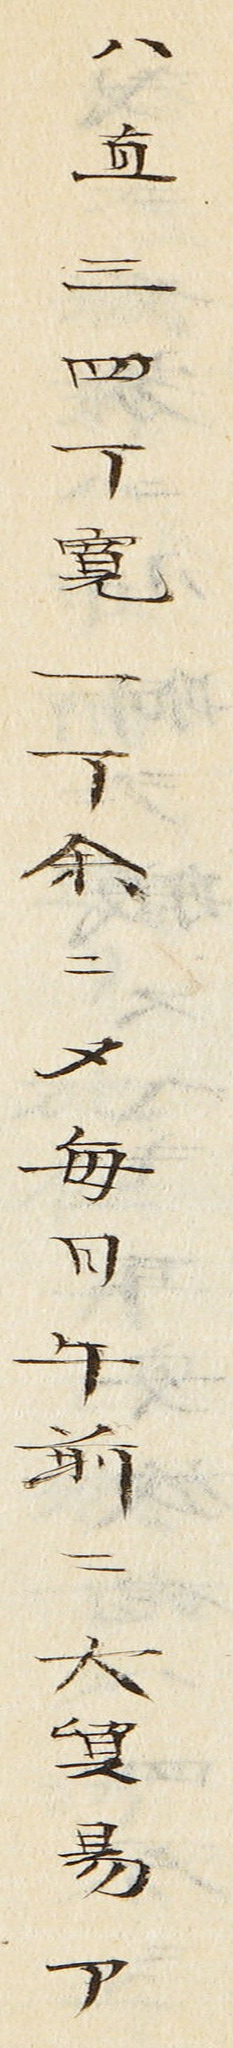ハ直三四丁寛一丁余ニシテ毎日五山二大貿易ア
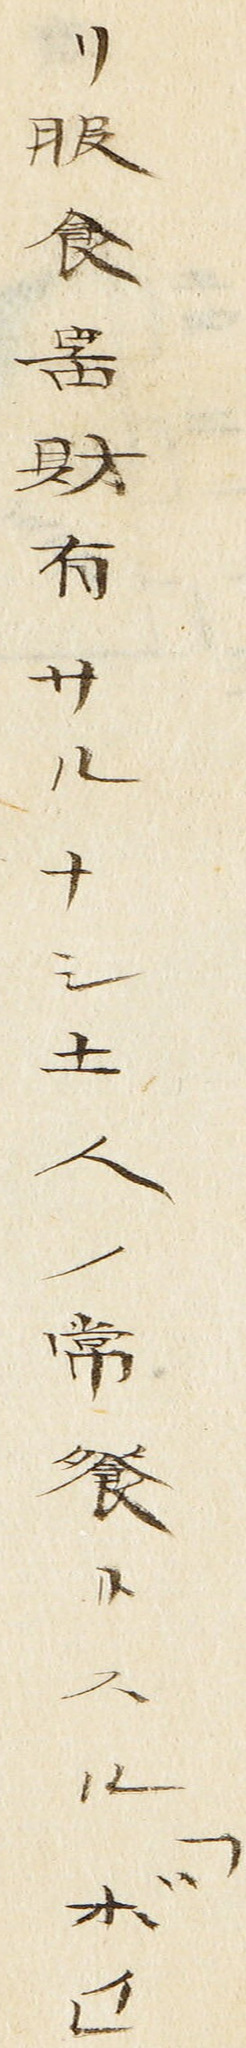リ服食器財有サルナシ土人ノ常餐トスル「ボイ」
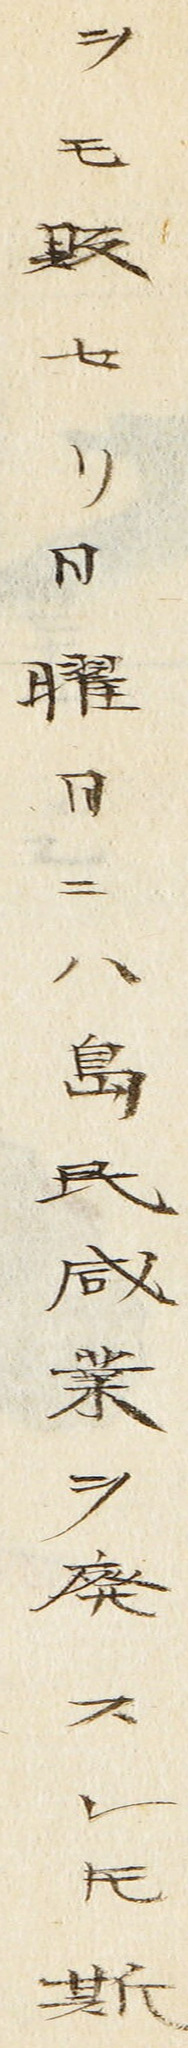ヲモ販セリ日曜日ニハ島民咸業ヲ廃スレトモ斯
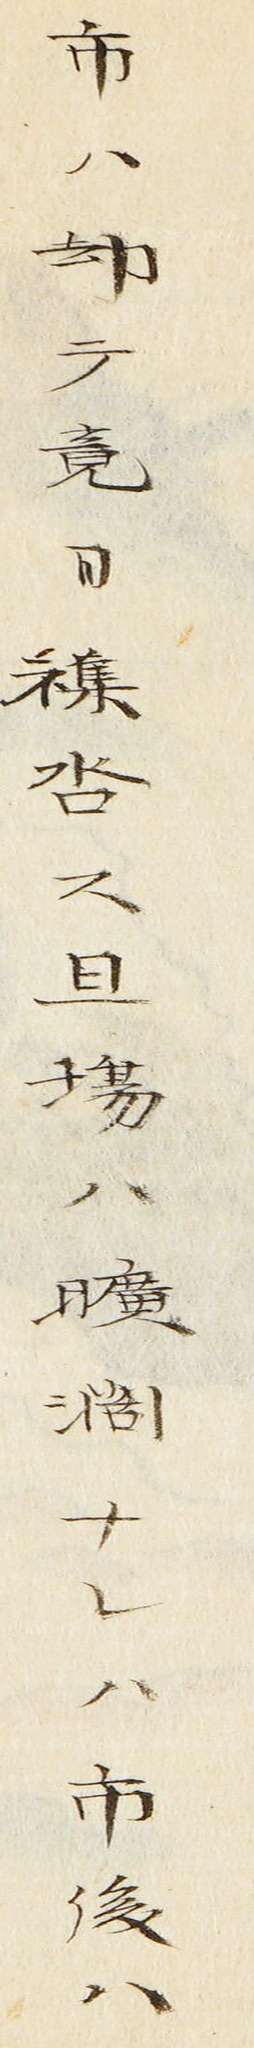市ハ却テ竟日襍沓ス旦場ハ矌濶ナレハ市後ハ
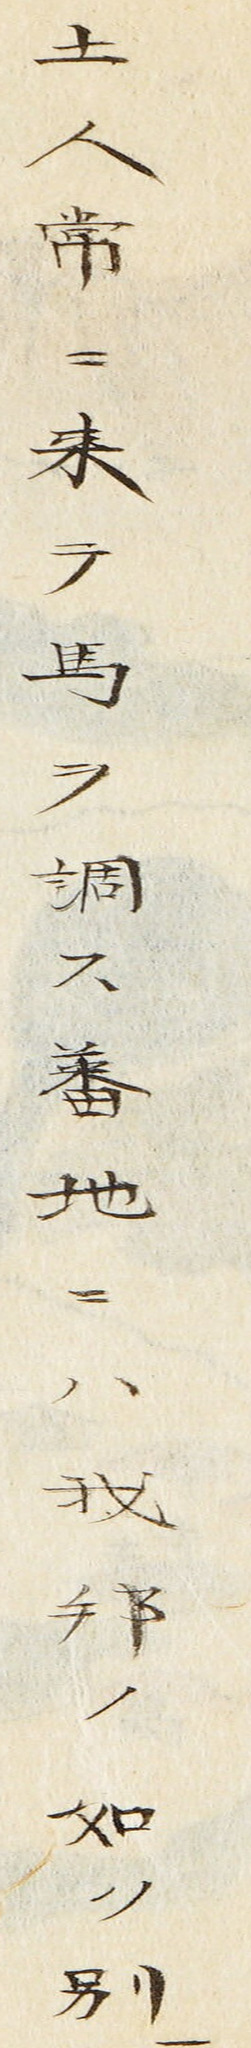土人常ニ来テ馬ヲ調ス蕃地ニハ我邦ノ如ク別
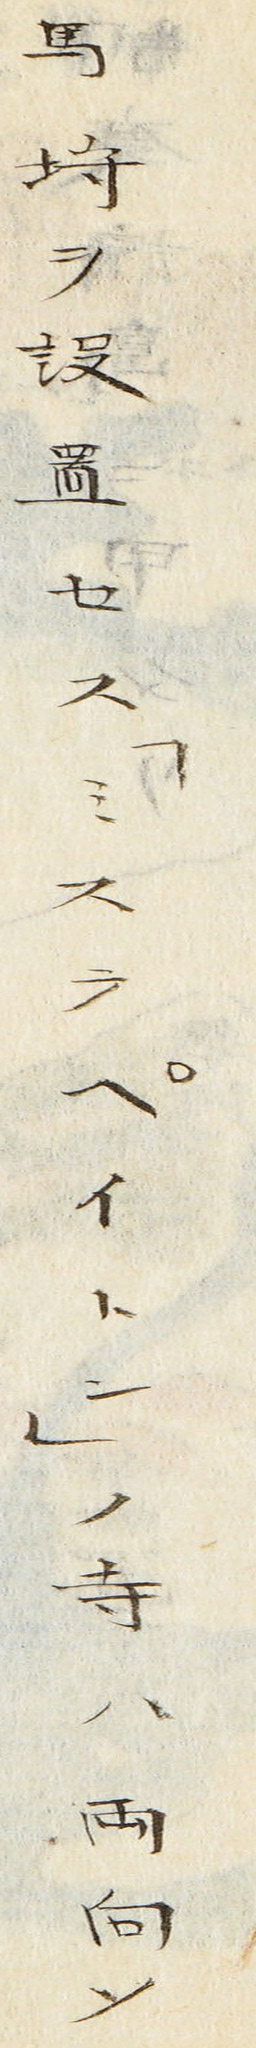馬埒？ヲ設置セス「ミスラペイトン」ノ寺ハ両向シテ
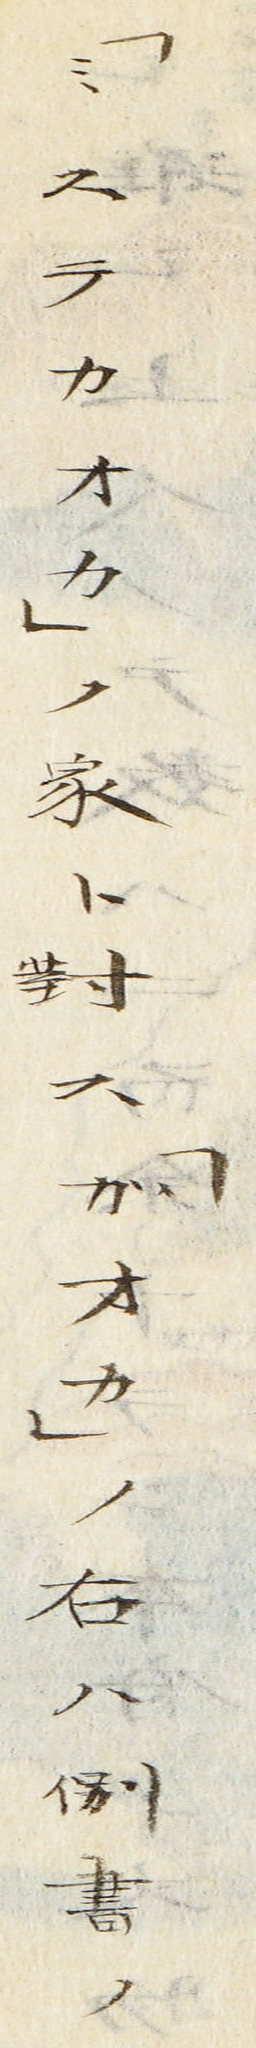「ミスラカオカ」ノ家ト對ス「ガオカ」ノ右ハ書ノ
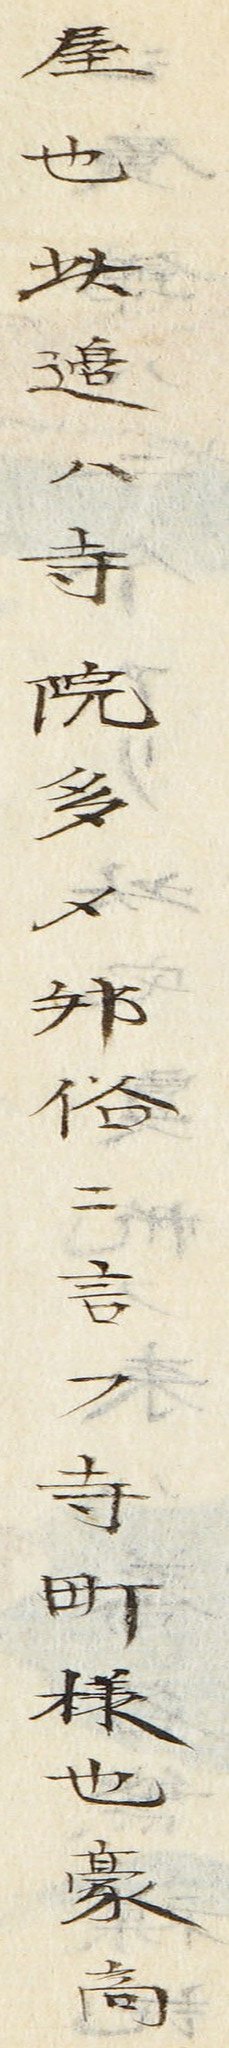屋也此邉ハ寺院多シテ邦俗ニ言フ寺町様也豪商
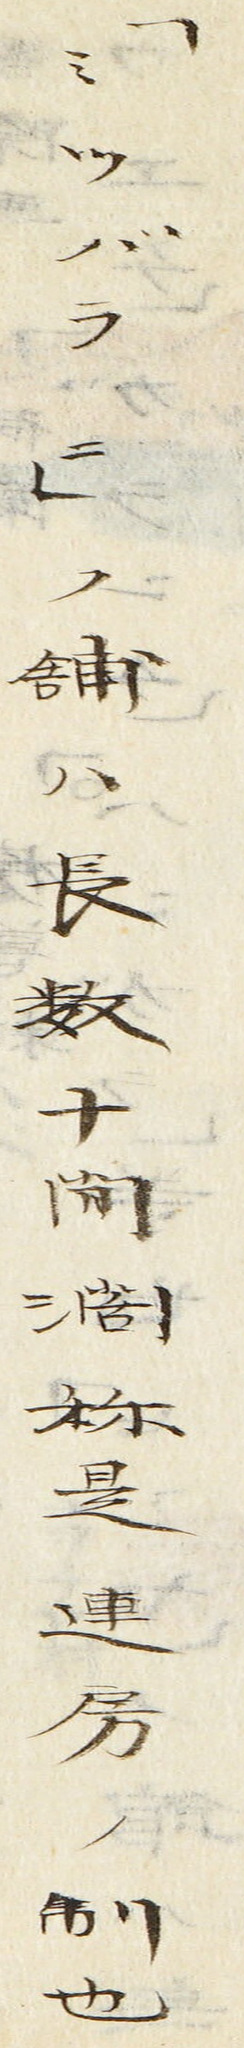「ミツバラニ」ノ舗ハ長数十間濶称是連房ノ制也
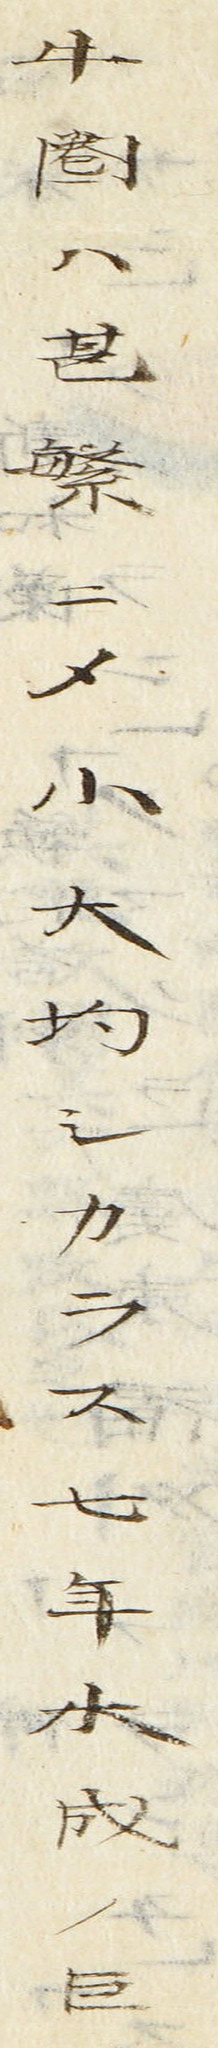井圏ハ甚繁ニシテ小大均シカラス七年木成ノ巨
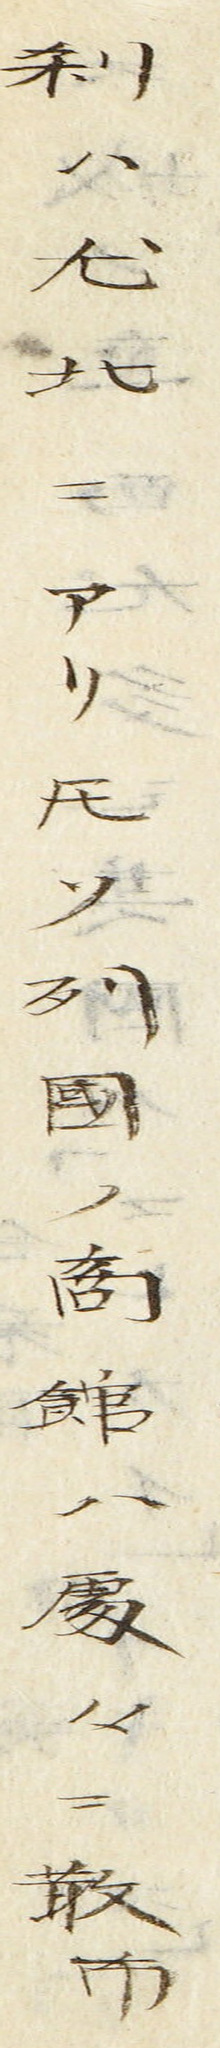刹ハ尤北ニアリ凡？ソ列国ノ商館ハ䖏々ニ散布

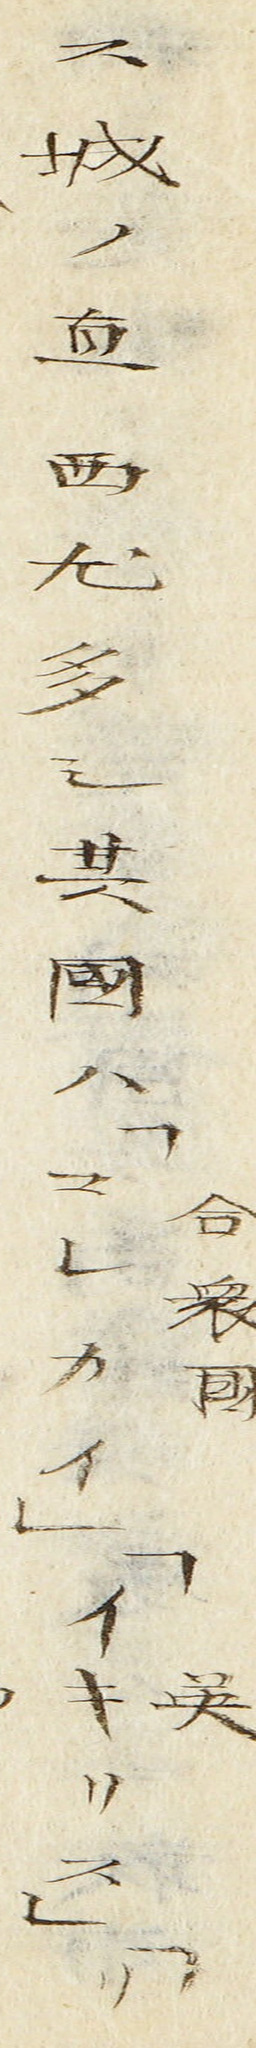ス城ノ直西尤多シ其國ハ「マレカイ」「イキリス」「リ
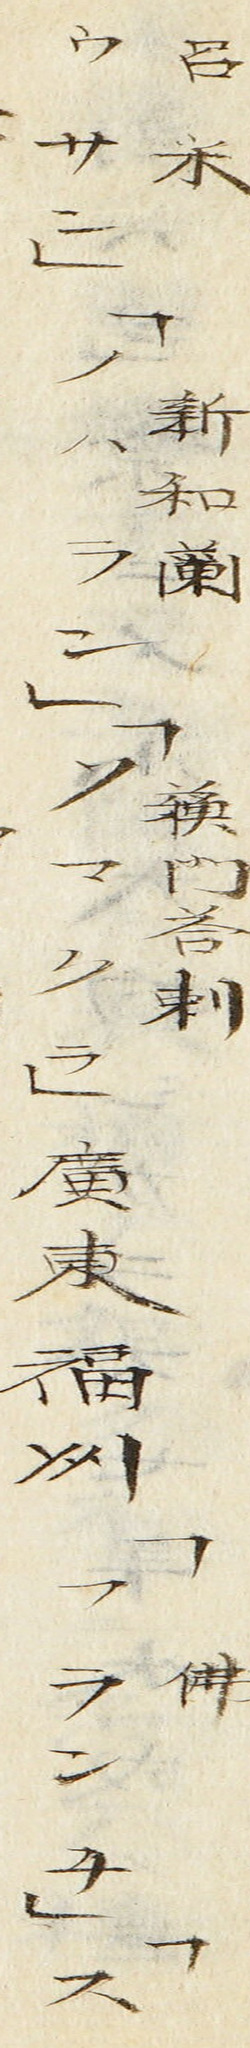ウサン」「ノハラン」「ノマクラ」廣東福州「フレンチ」「ス
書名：蕃談
